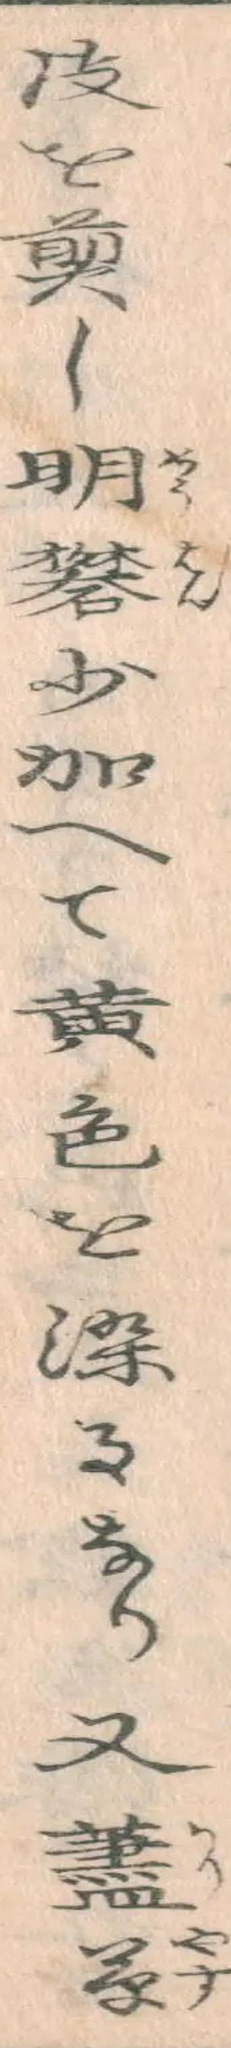皮を煎し明礬少加へて黄色を染るなり又藎草
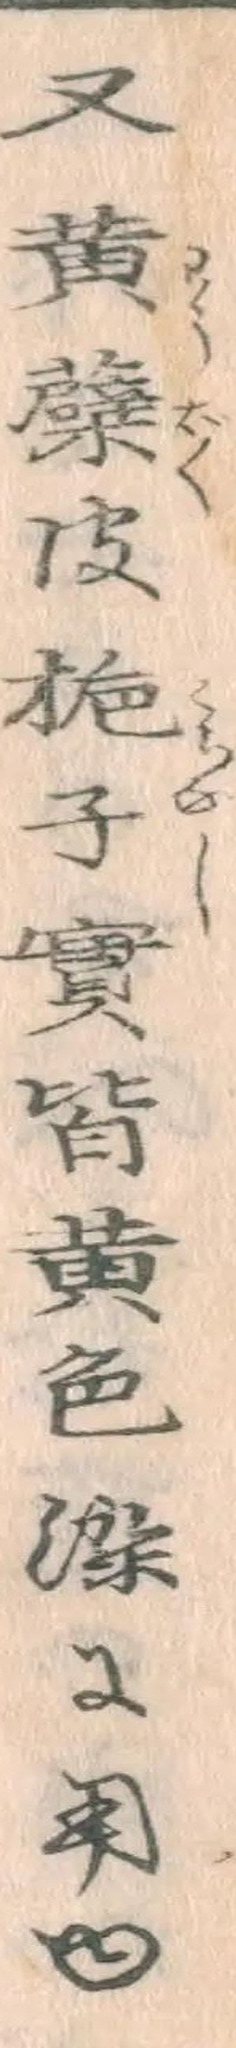又黄蘗皮梔子実皆黄色染に用ゆ
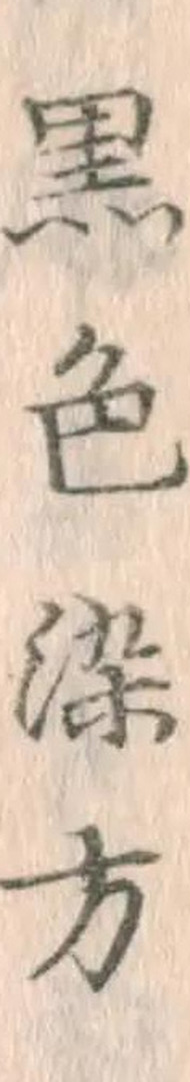黒色染方
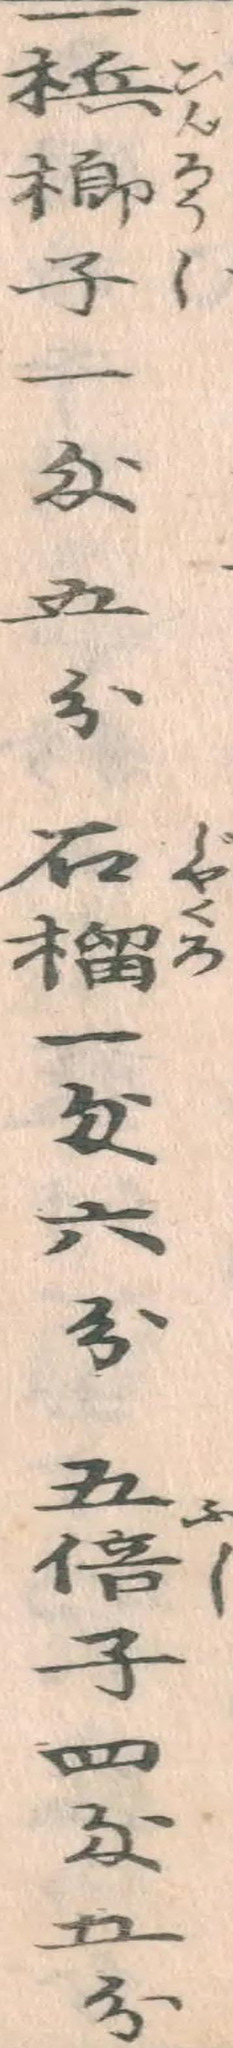一梹榔子一匁五分石榴一匁六分五倍子四匁五分
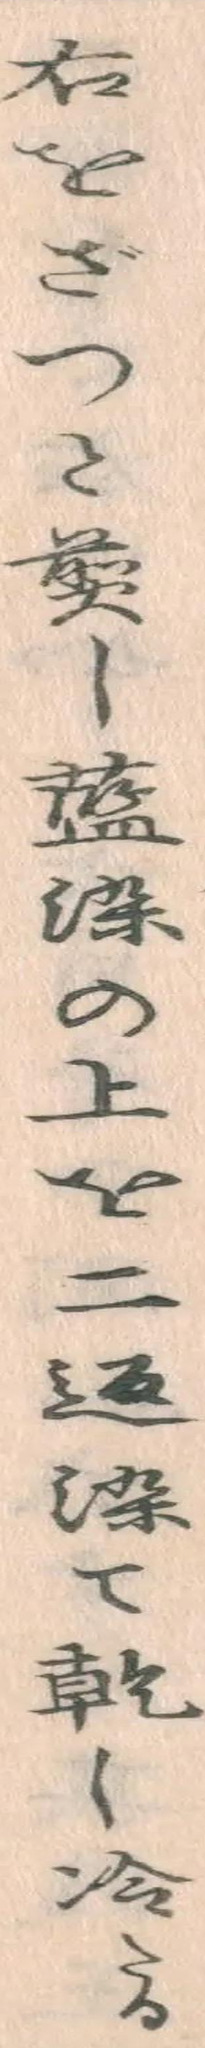右をざつと煎し藍染の上に二返染て乾し冷たる
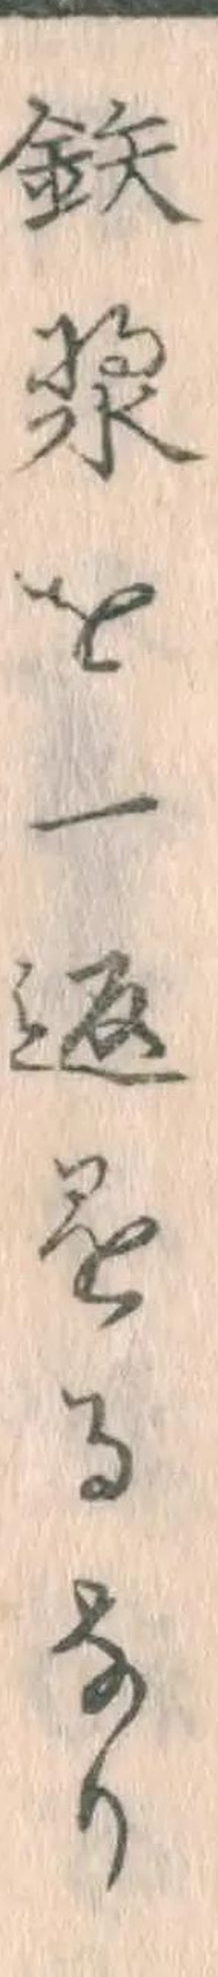鉄漿を一返懸るなり
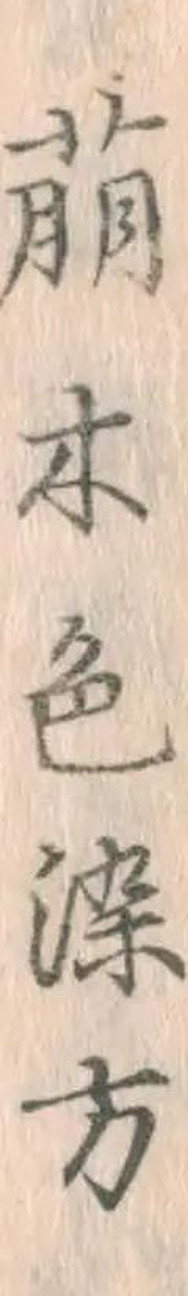萌木色染方
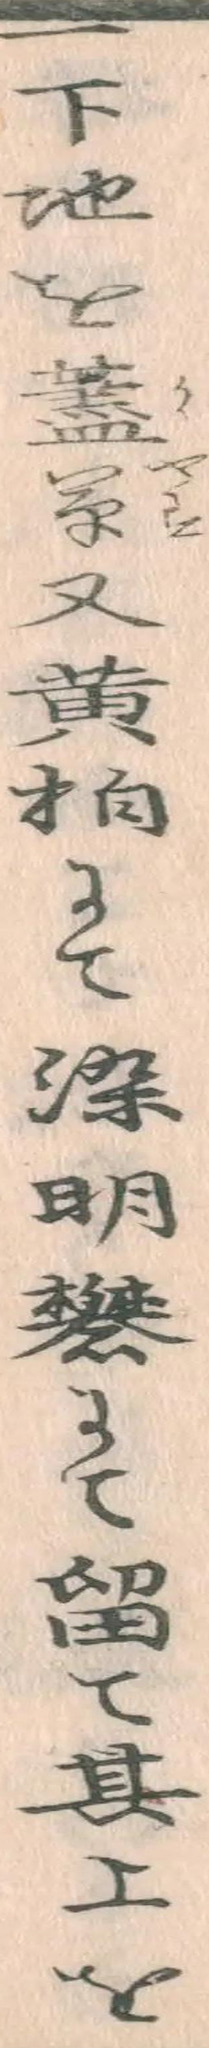一下地を藎草又黄柏にて染明礬にて留て其上を
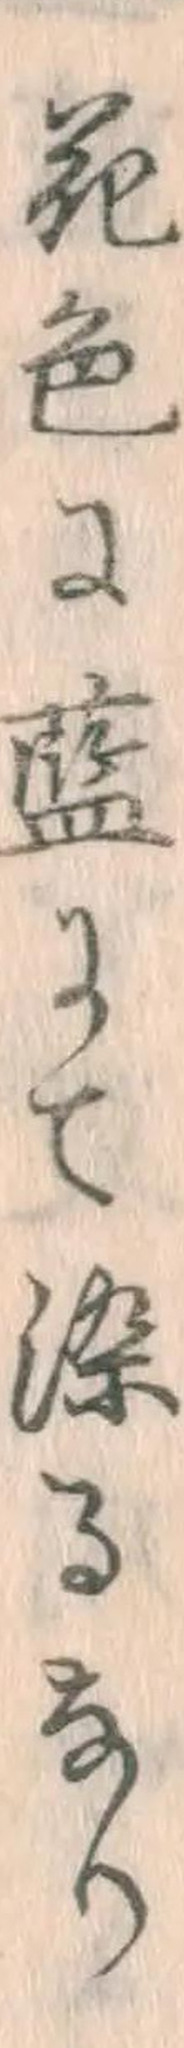花色に藍にて染るなり
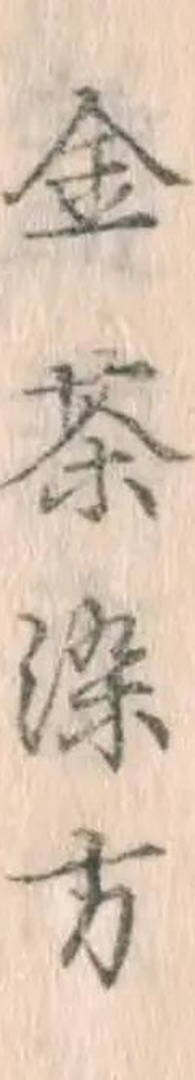金茶染方
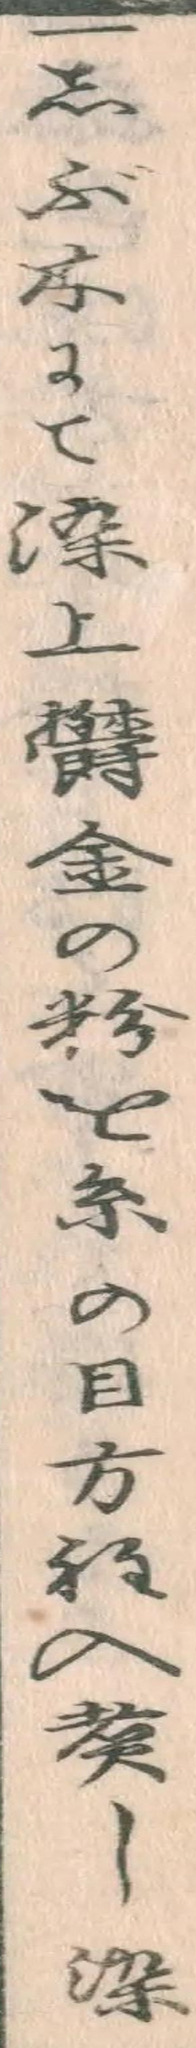一しぶ木にて染上鬱金の粉を糸の目方程入煮し染
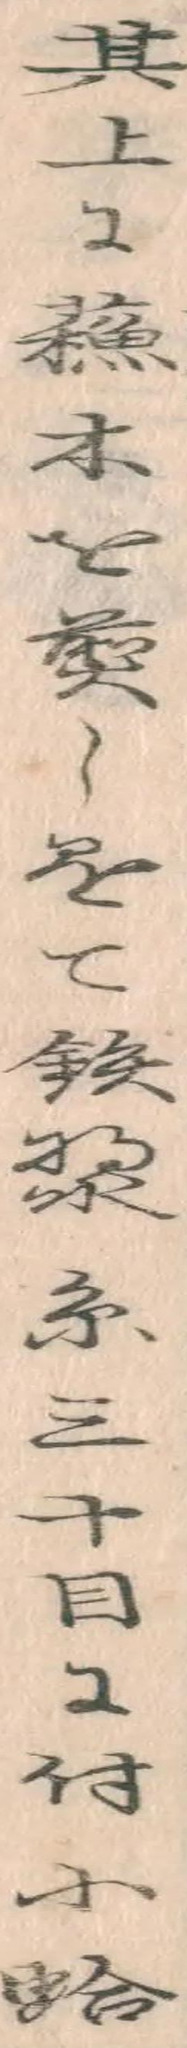其上に蘓木を煎し懸て鉄漿糸三十目に付小蛤
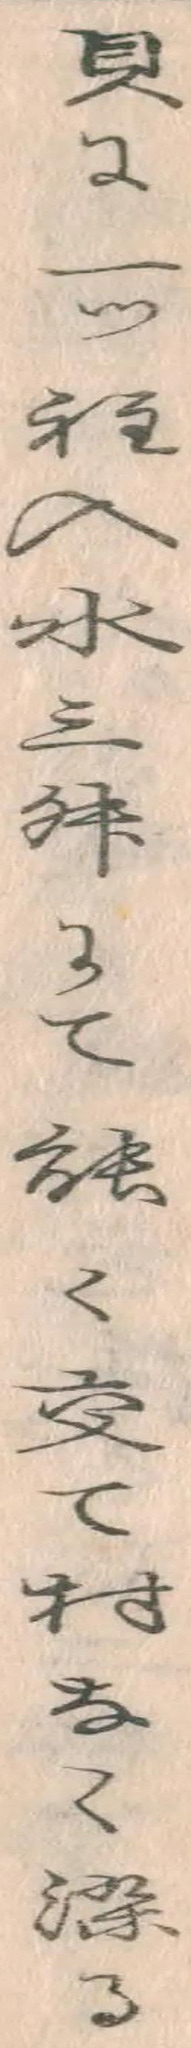貝に一ツ程入水三升にて能く交て村なく染る
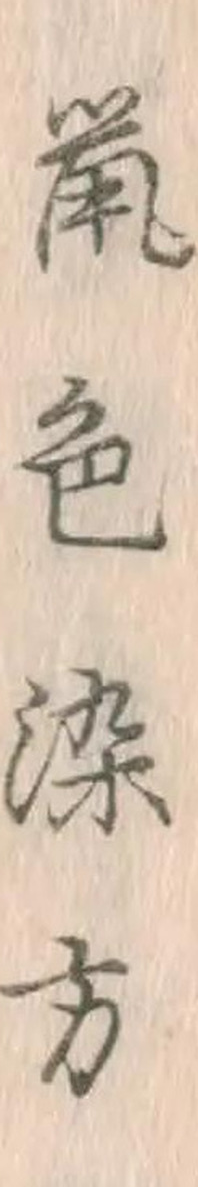鼠色染方
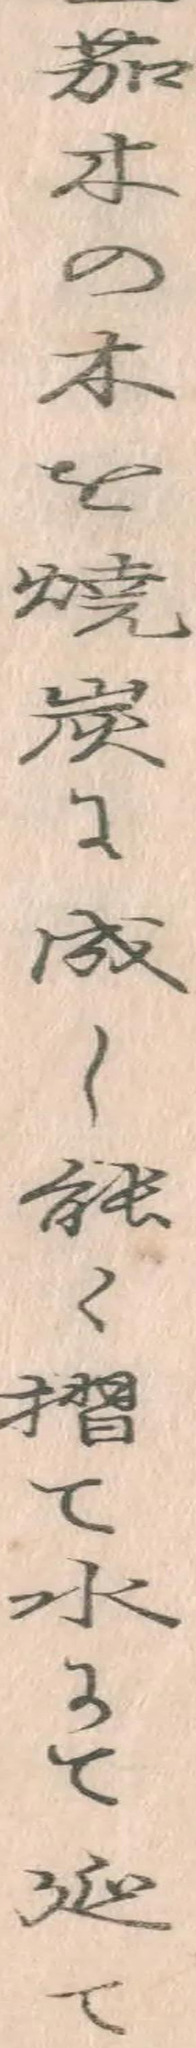一茄木の木を焼炭に成し能く摺て水にて延て
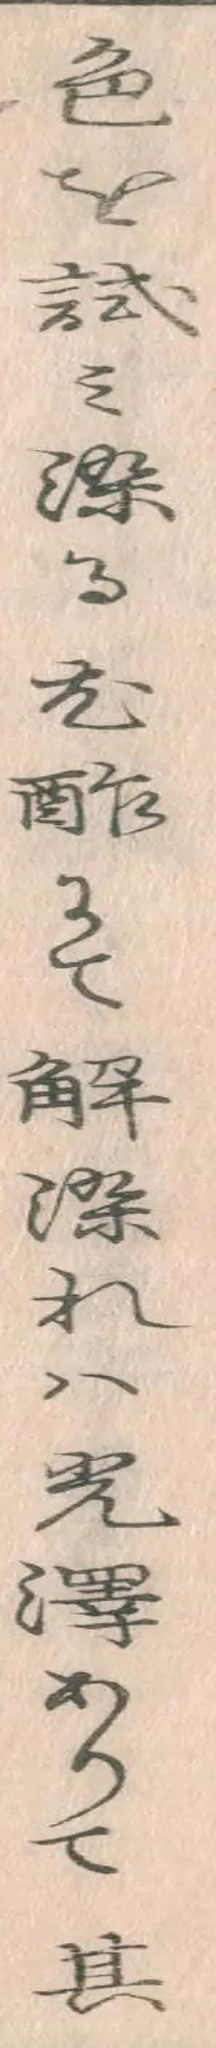色を試み染る尤酢にて解染れは光沢ありて其
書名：機織彙編 5巻. [1]
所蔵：国立国会図書館 National Diet Library, JAPAN
